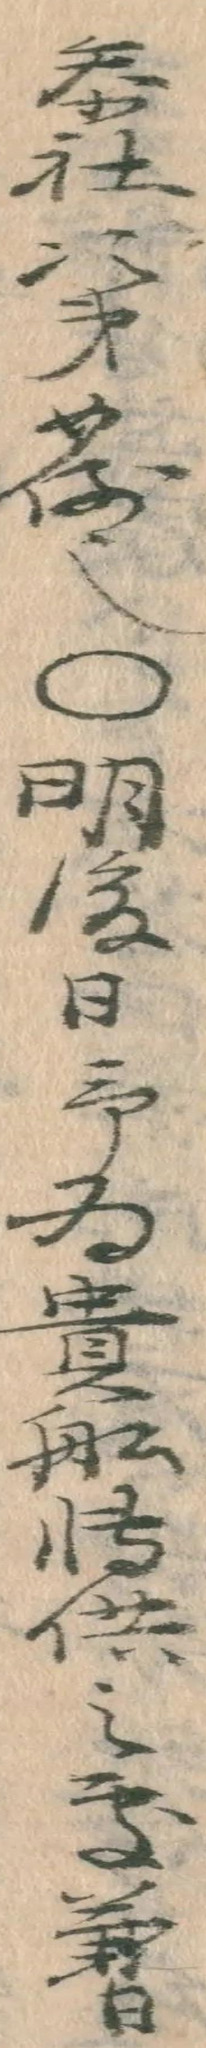参社次第如何也○明後日予為貴舩轉供之處兼日
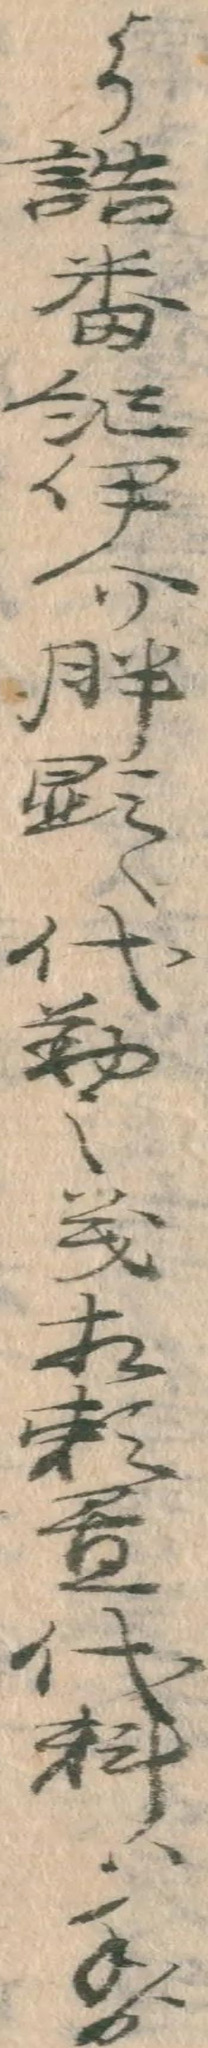より詰番紀伊介胖顕彰代勤之義相頼置代料ハ手ゟ
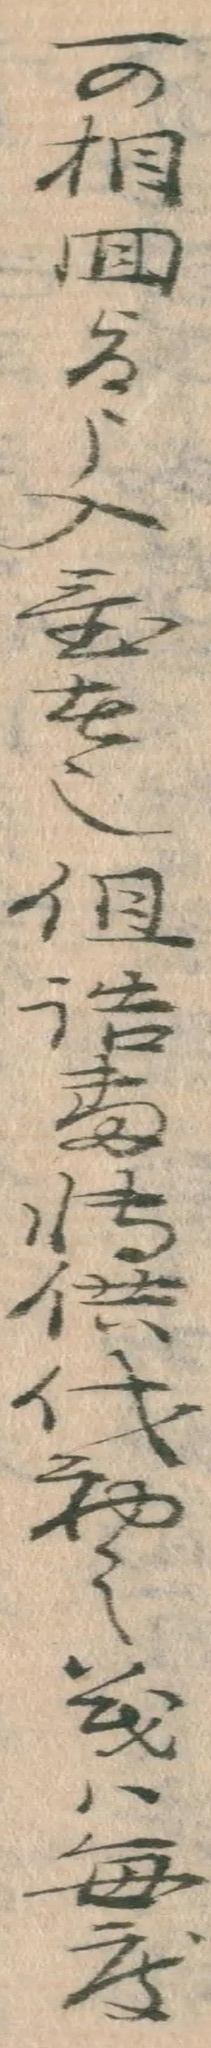可相回旨申入置去也但詰番轉供代勤之義ハ毎度
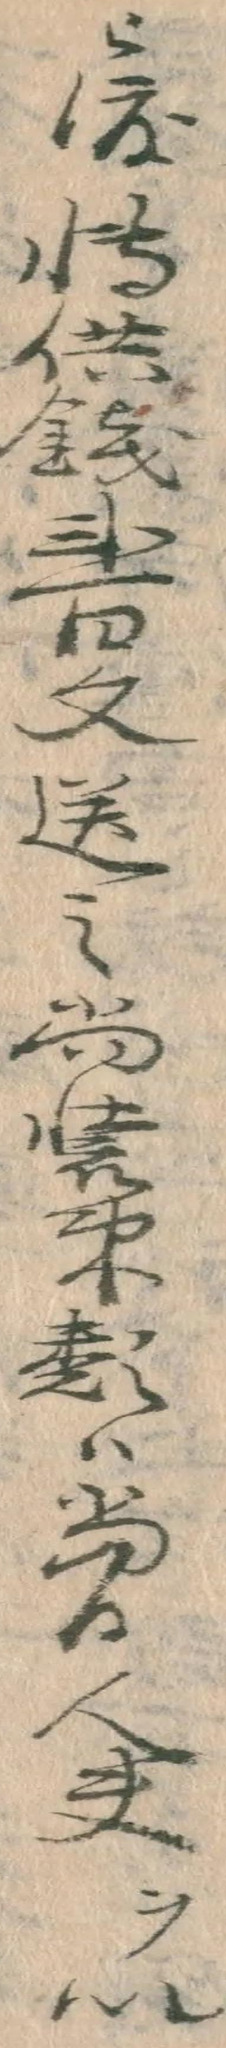被渡轉供銭弐百文送之尚装束類ハ當日人夫ヲ以
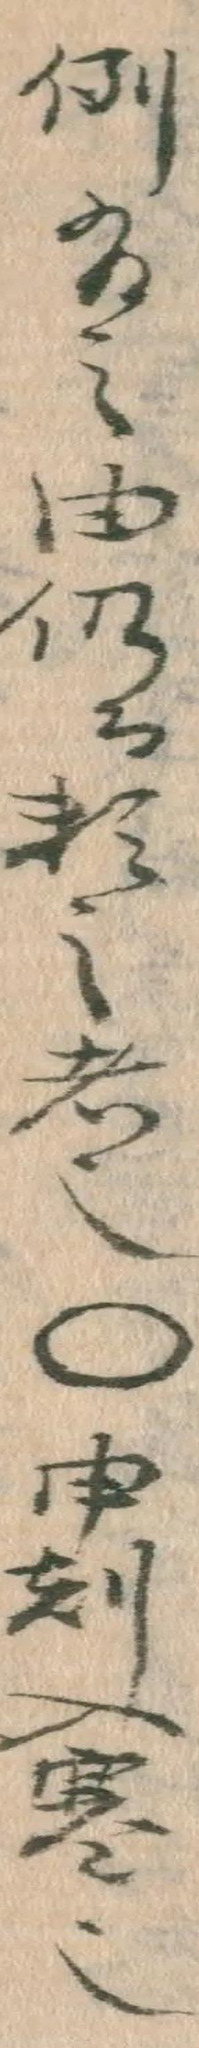例有之由仍而頼之者也○申刻入寒也
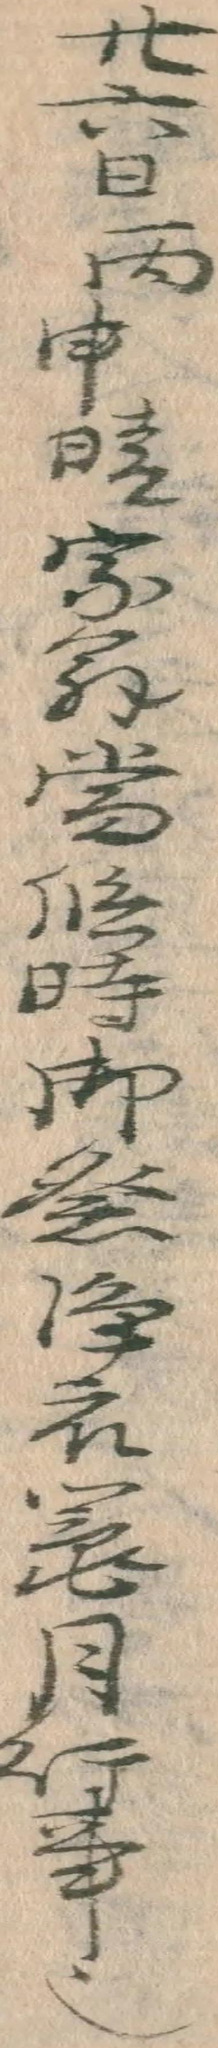廿六日丙申晴家翁當臨時御祭浄衣鬮月行事也
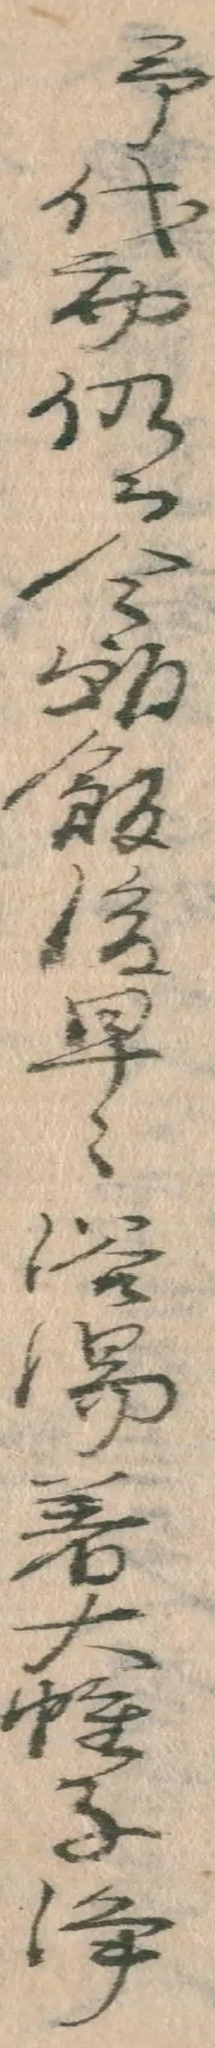予代勤仍而今朝飯後早〻浴湯着大帷子浄
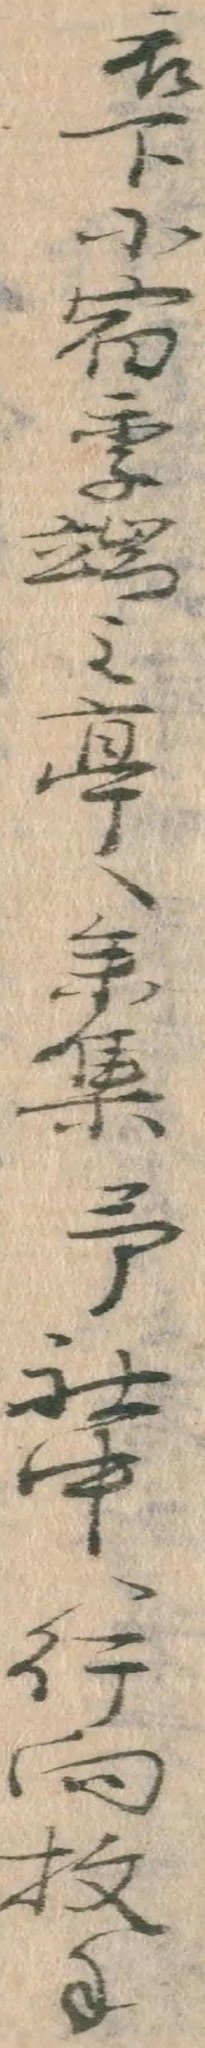衣下小宿季端之亭へ参集予社中へ行向牧手
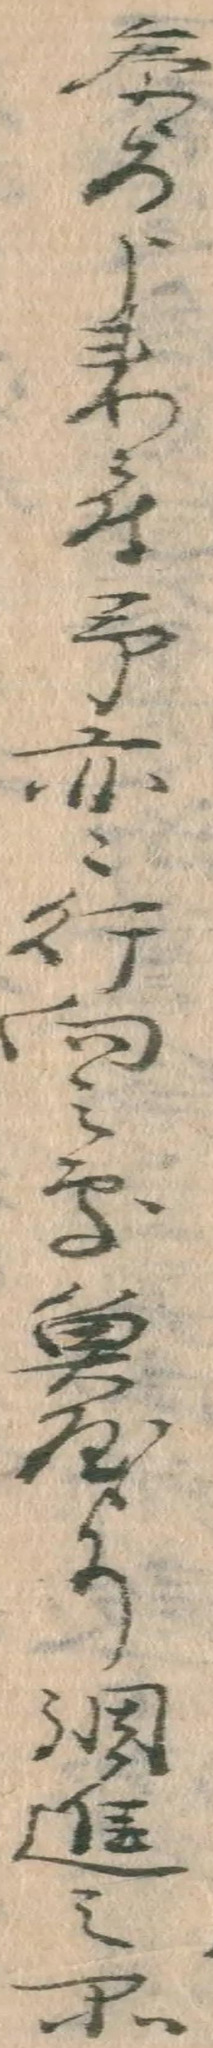参候旨申来候付予亦々行向之處魚屋より調進之品
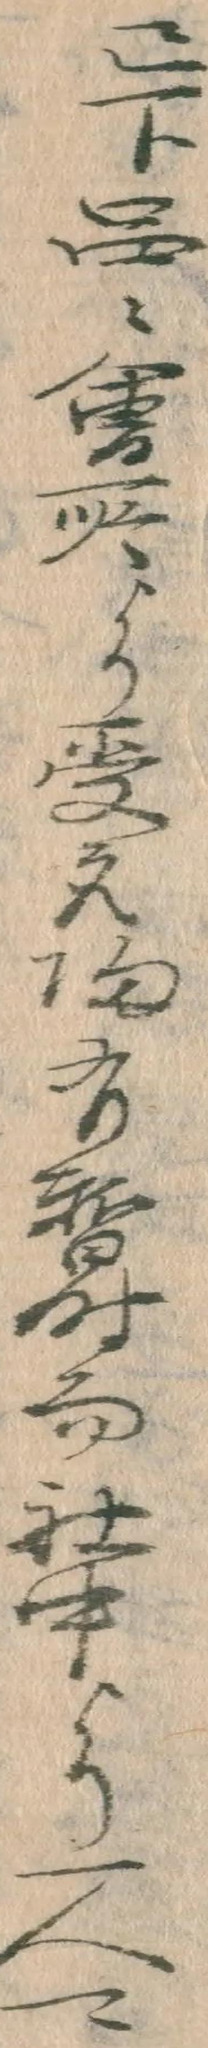已下品々會所より受取帰有暫時て社中より一人可
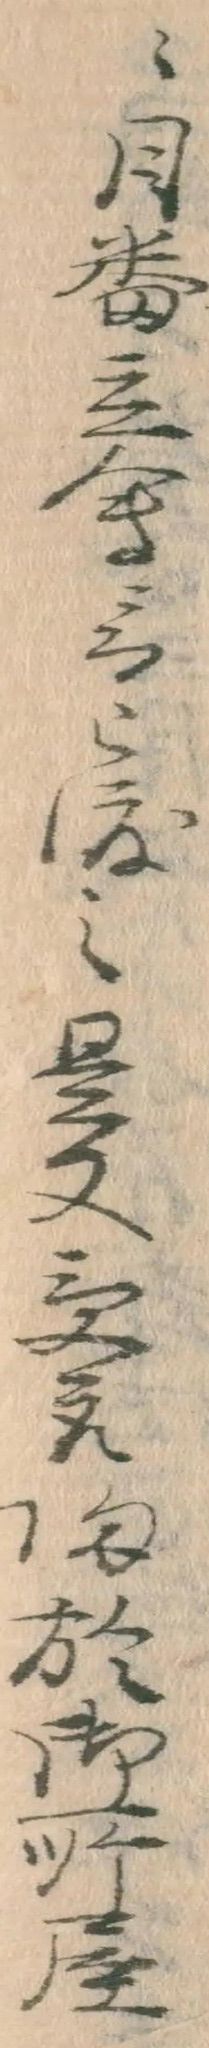々月番立會に而被渡之是又受取帰於御所屋
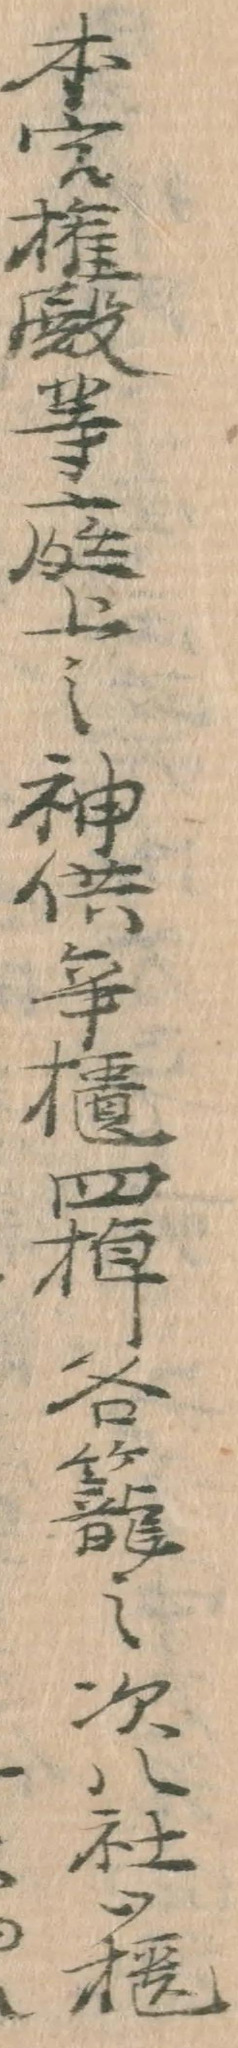本宮権殿等庭上之神供辛櫃四棹各籠之次八社御櫃
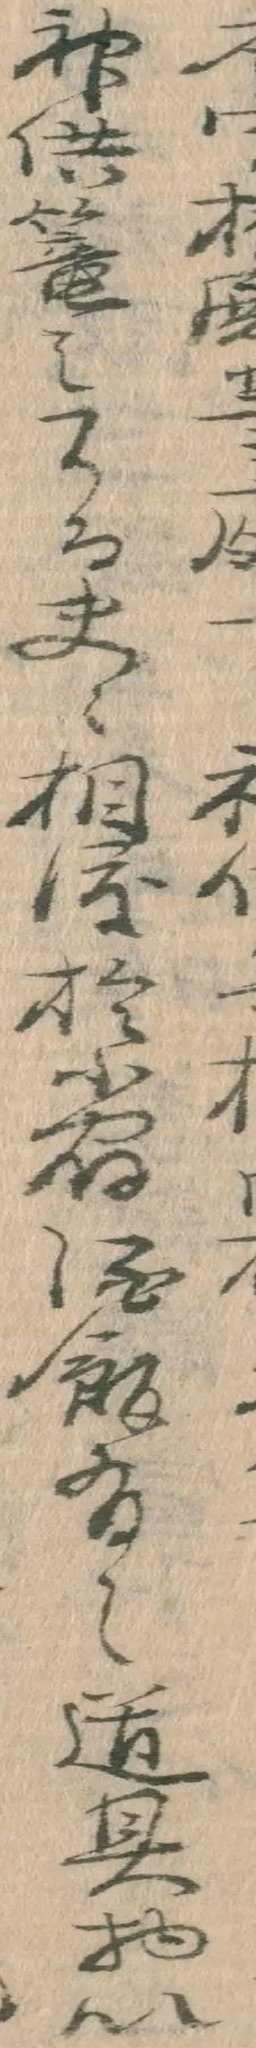神供篭之了而夫々相渡於小宿酒飯有之道具物以
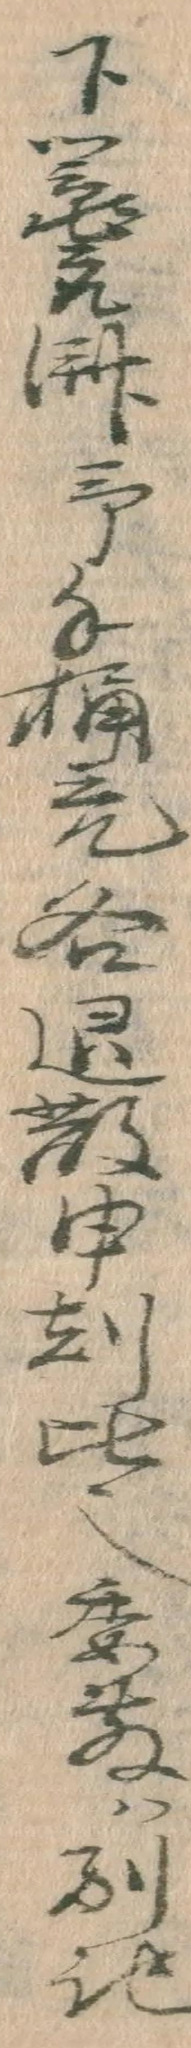下鬮取済予手桶充各退散申刻比也委敷ハ別記
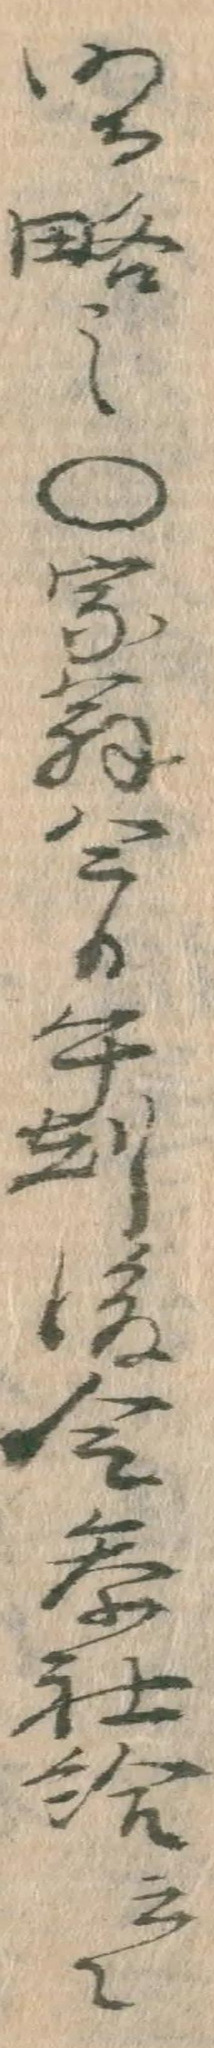仍而略之○家翁今日午刻後令参社給云々
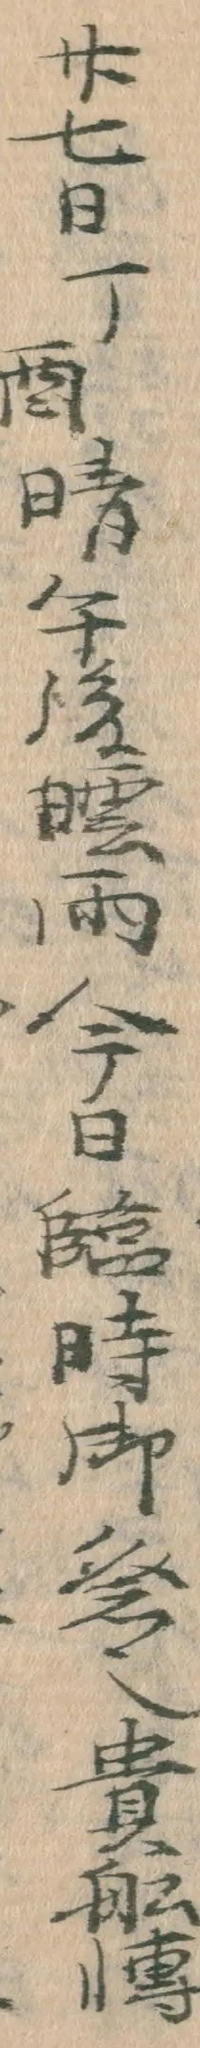廿七日丁酉晴午後暁雨今日臨時御祭也貴舩轉
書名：賀茂社記録. 第63冊
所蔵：国立国会図書館 National Diet Library, JAPAN
